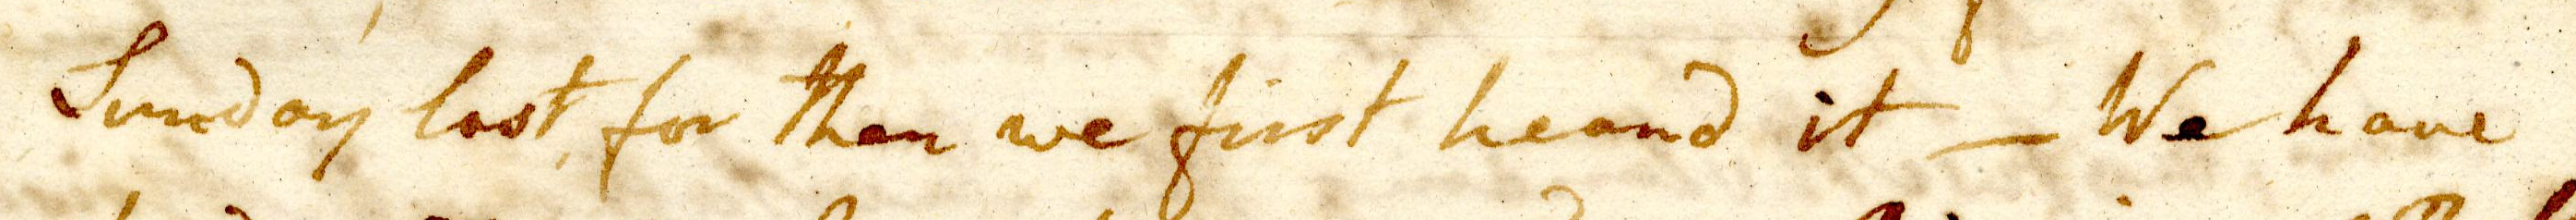Sunday last, for then we first heard it- We have
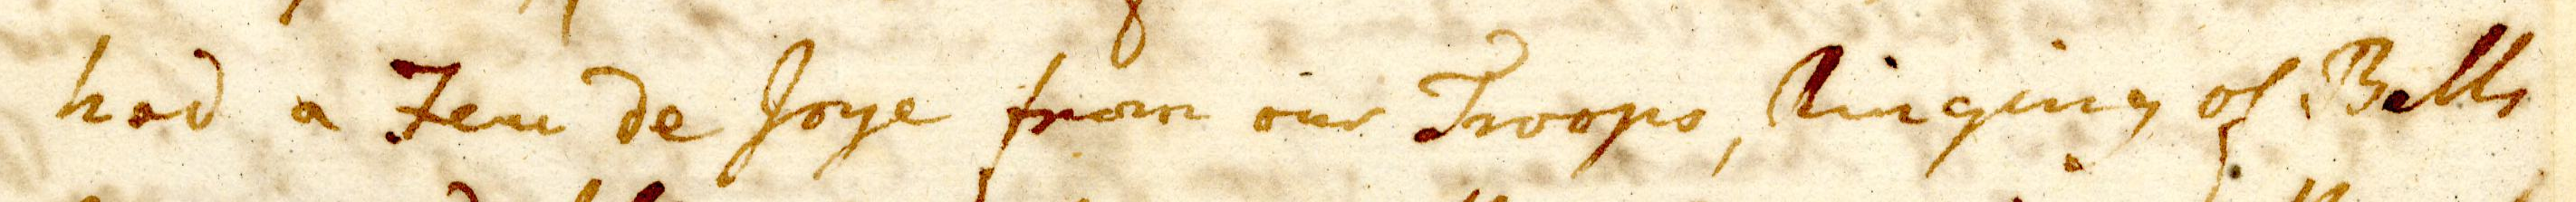had a Feu de Joye from our Troops, Ringing of Bells
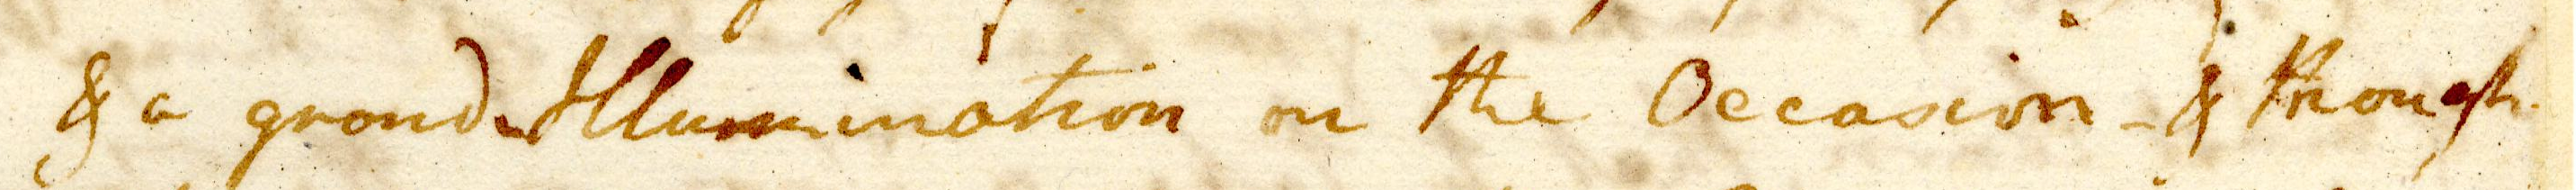& a ground Illumination on the Occasion- & though
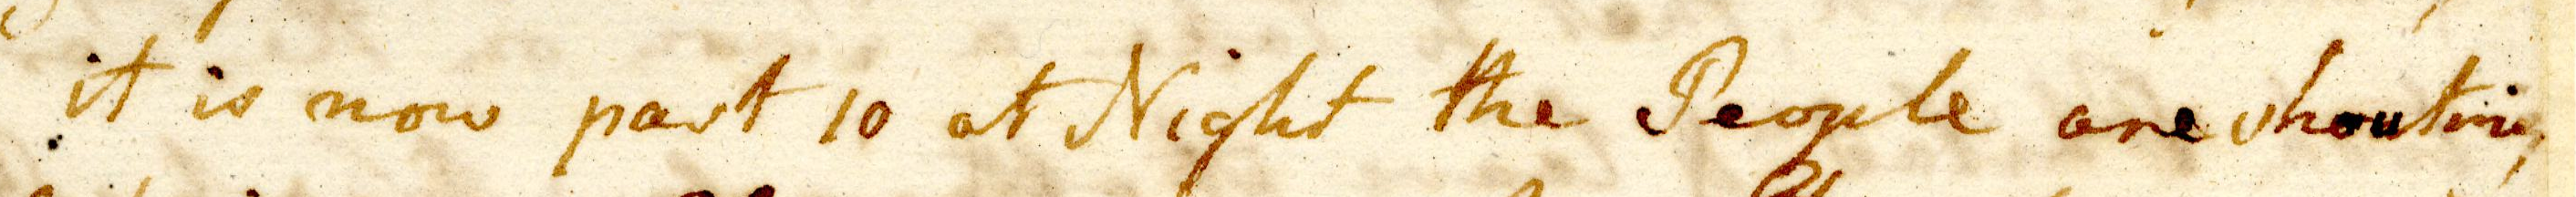it is now past 10 at Night the People are shouting
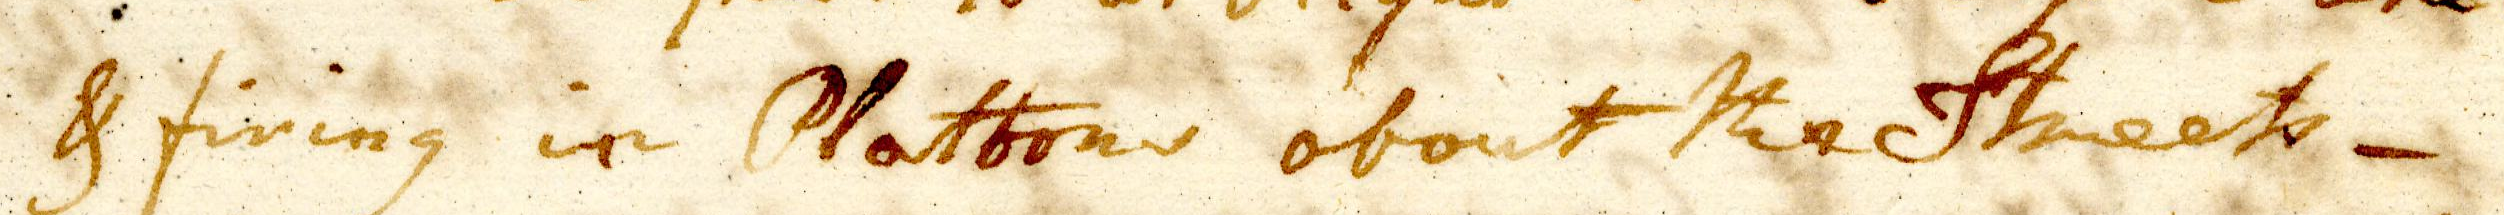& firing in Plattoons about the Streets-
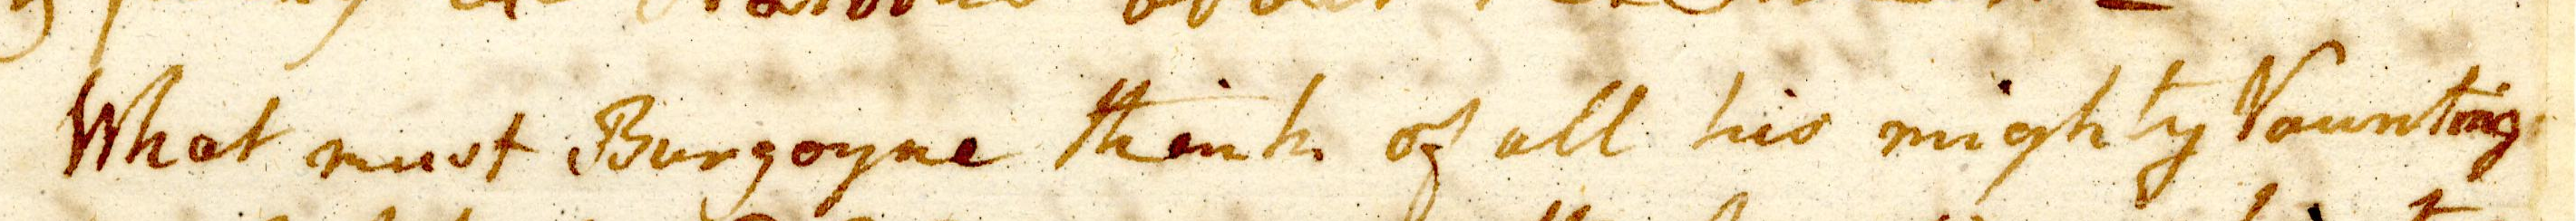What must Burgoyne think of all his mighty Vaunting
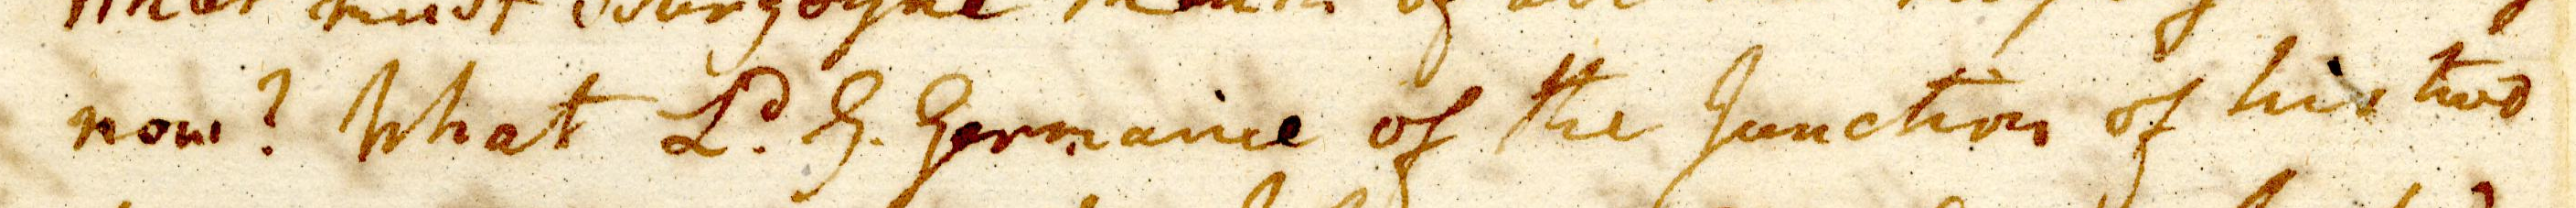now? what L^d. G. Germaine of the Junction of his two
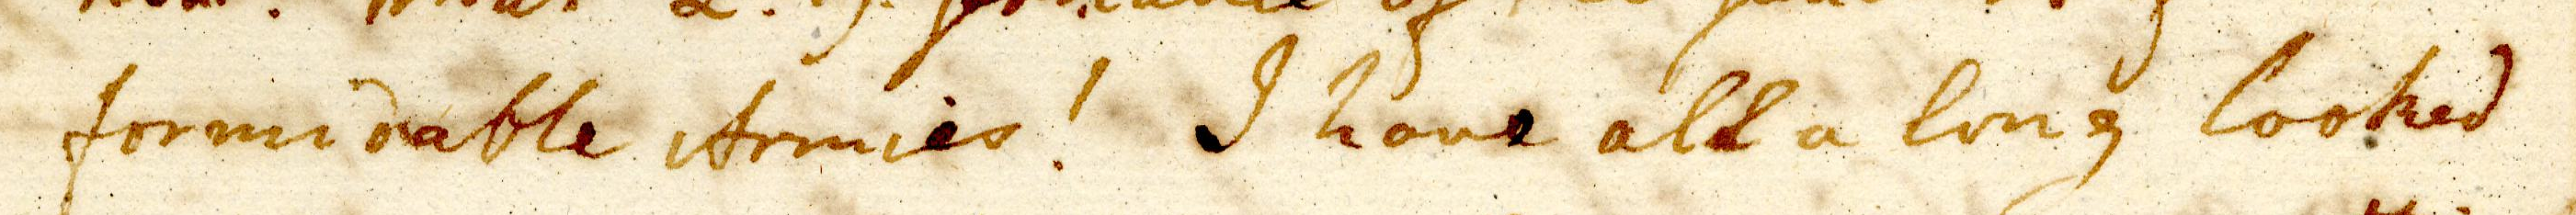formidable Armies! I have all a long looked
